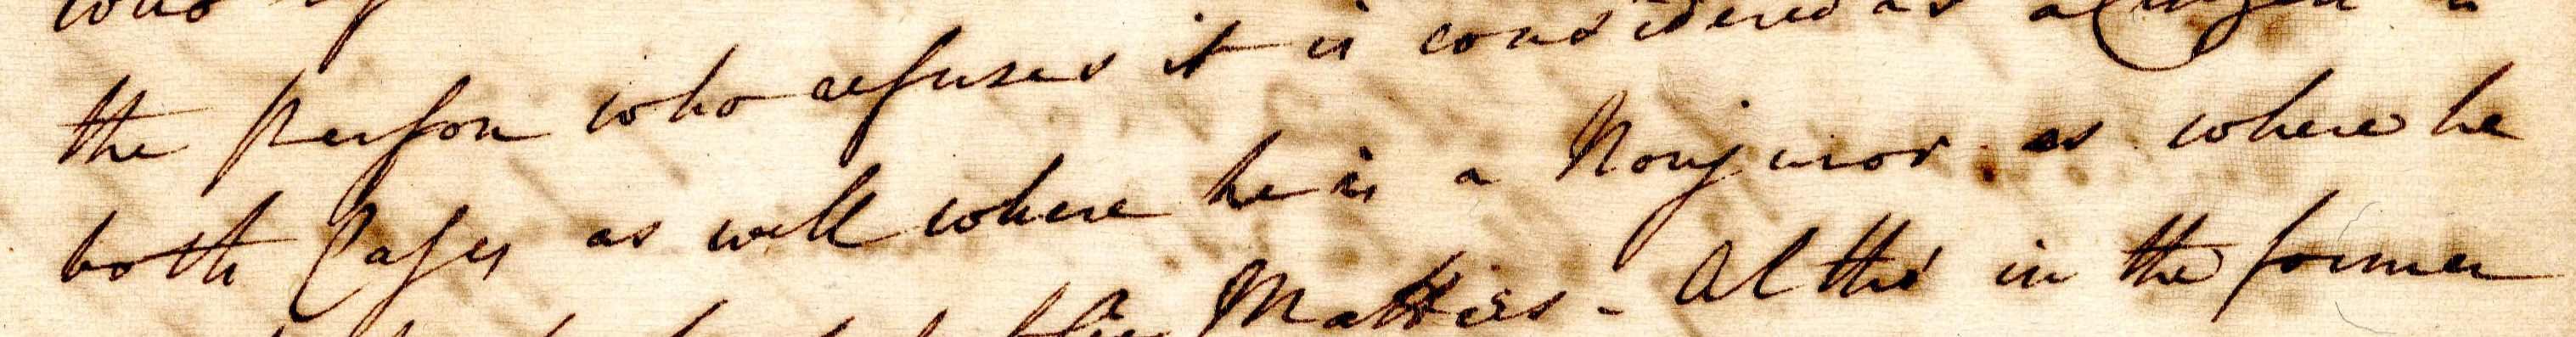both Cases as well where he is a Noujuror, as where he
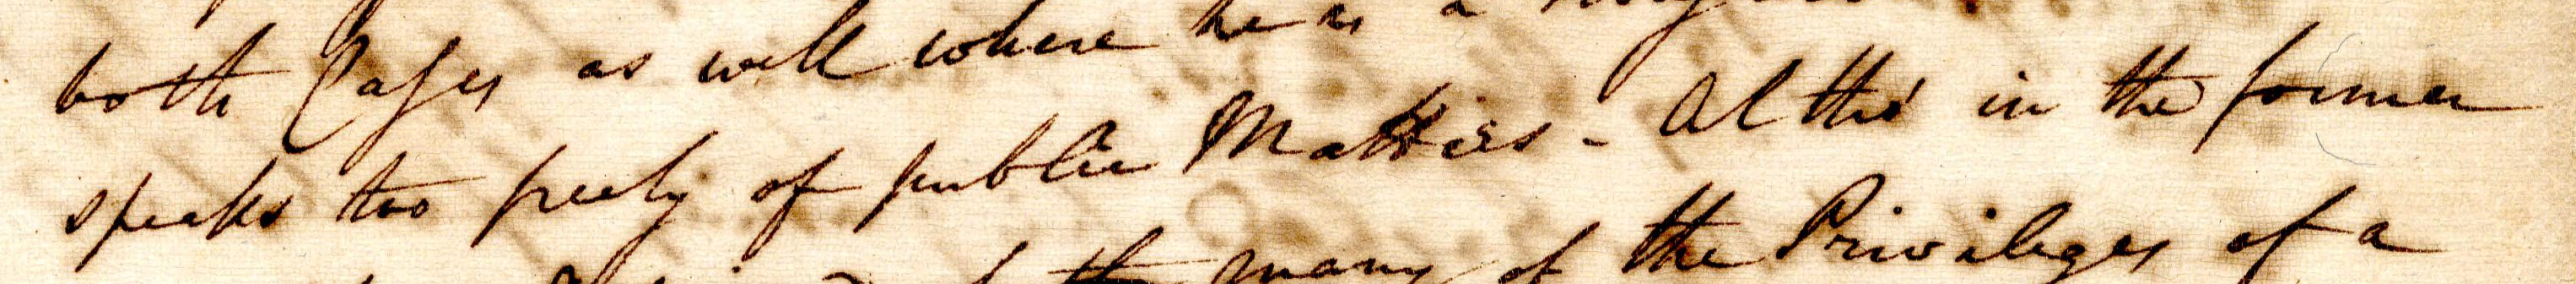speaks too freely of public Matters. Altho' in the former
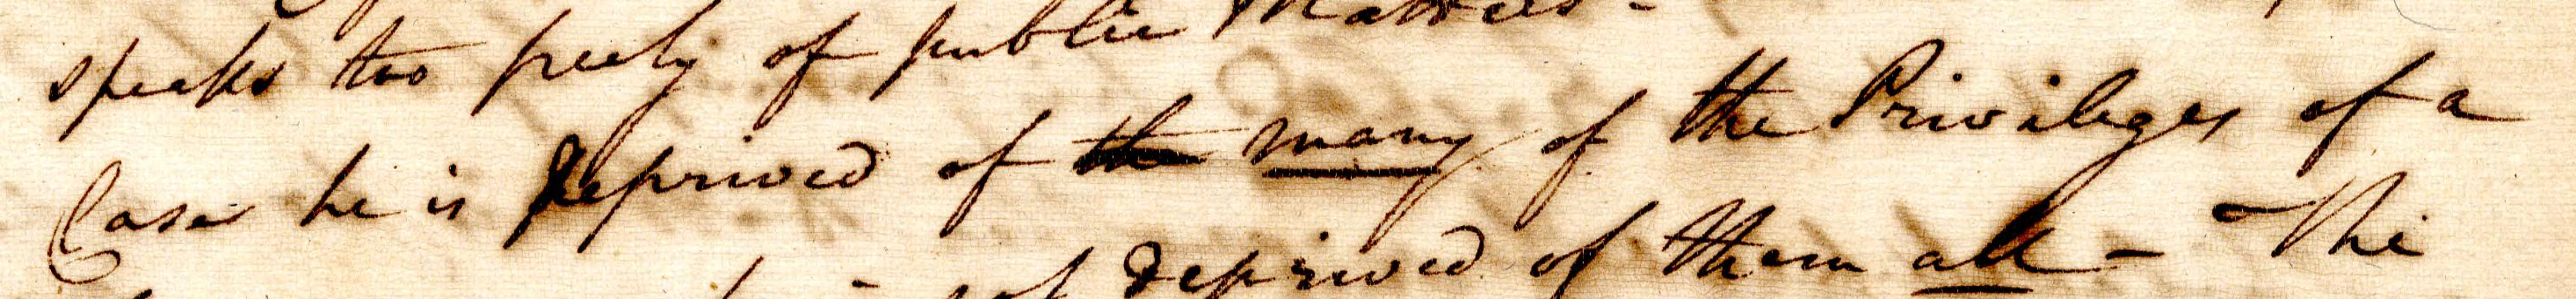Case he is deprived of the many of the Privileges of a
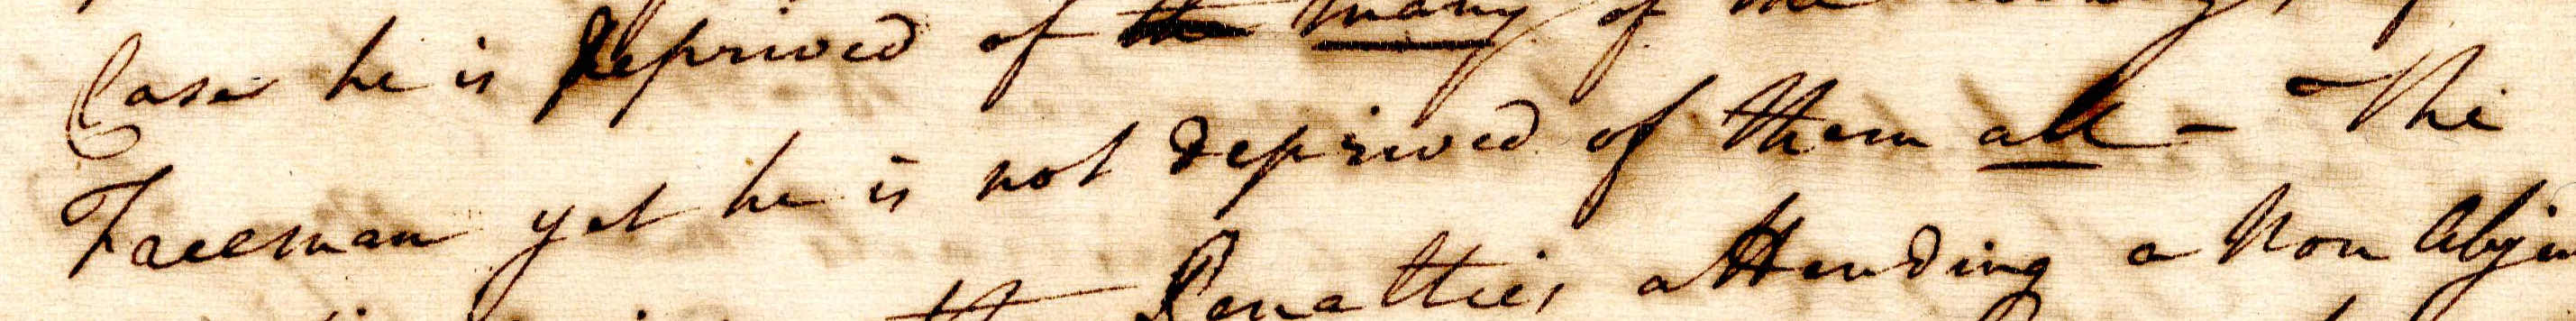Facesuan yet he is not deprived of them all- The
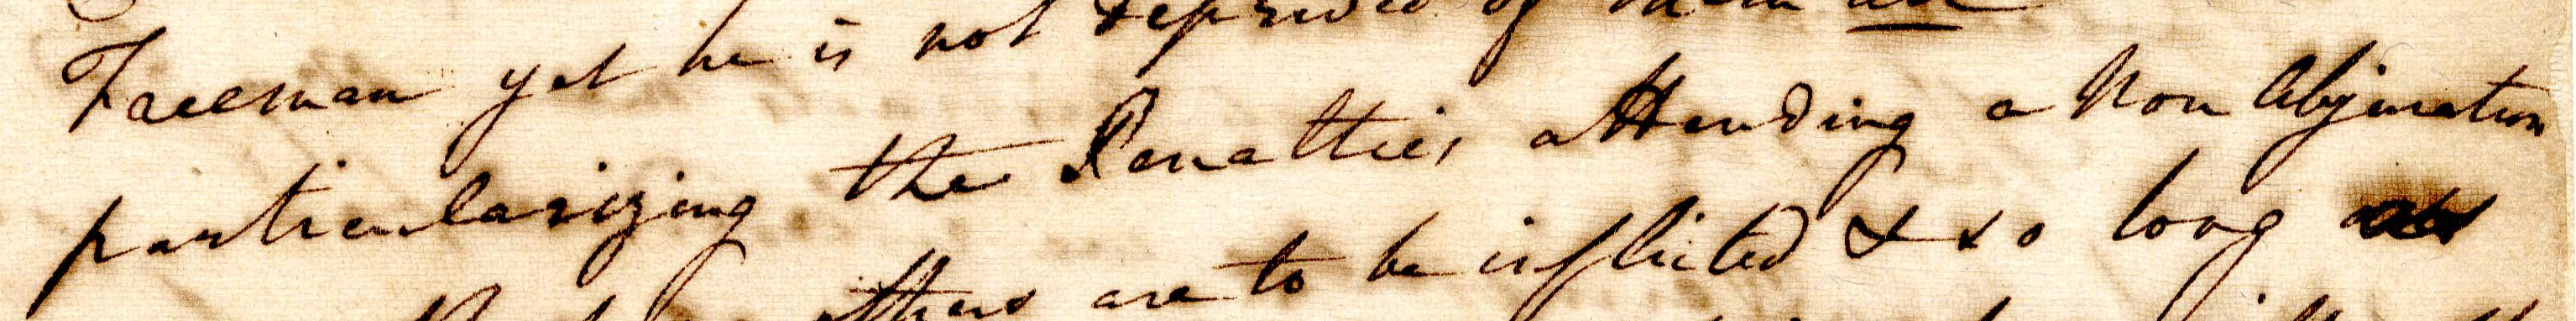particularizing the Penalties attending a Non Abjuration
